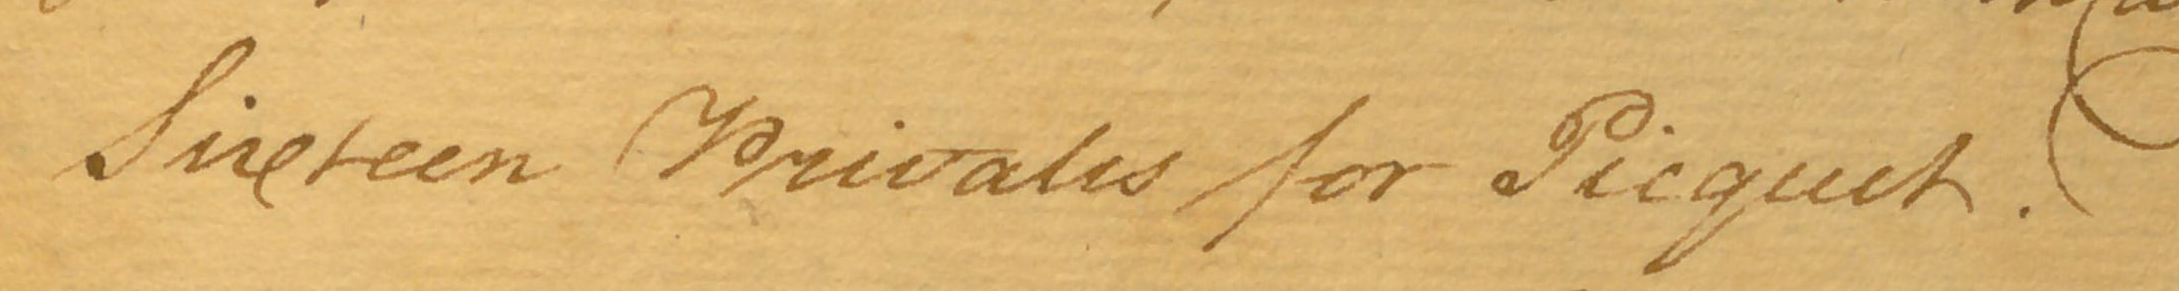Sixteen Privates for Picquet.
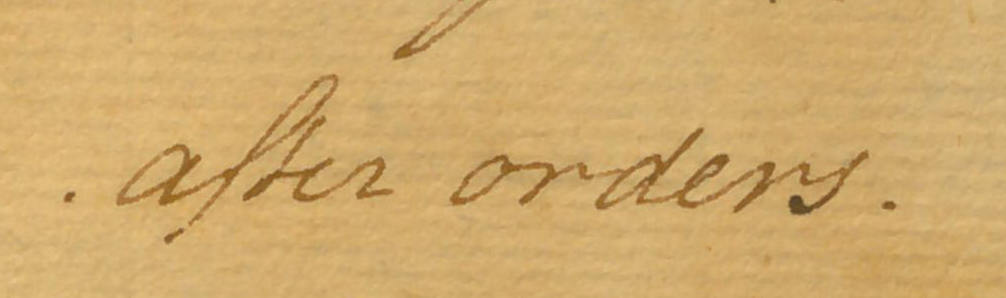after orders.
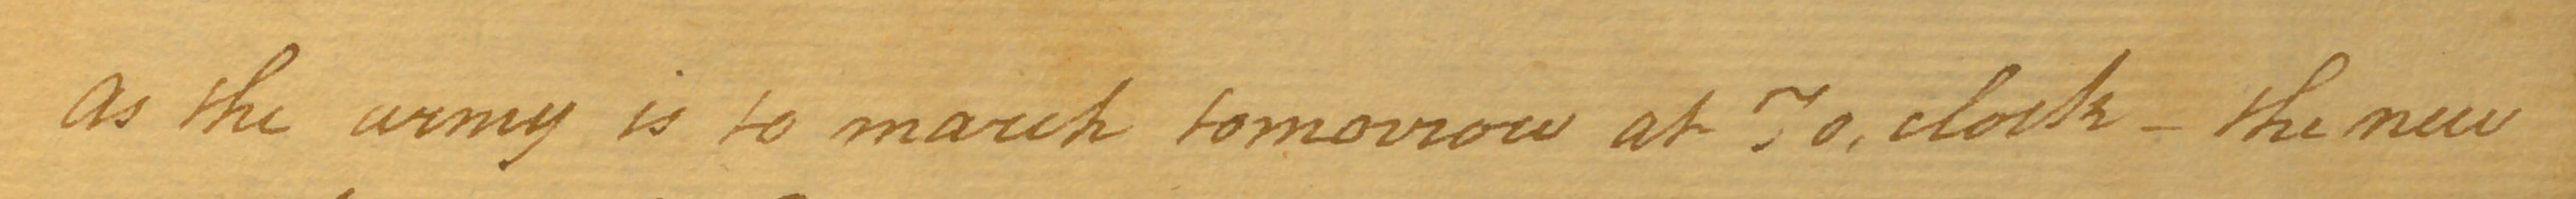As the army is to march tomorrow at 7 o.clocl- the new
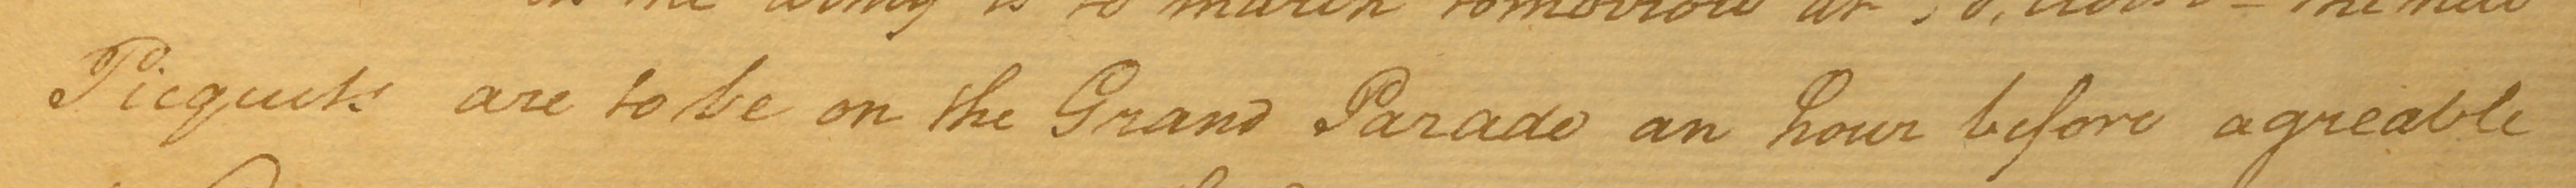Picquets are to be on the Grand Parade an hour before agreable
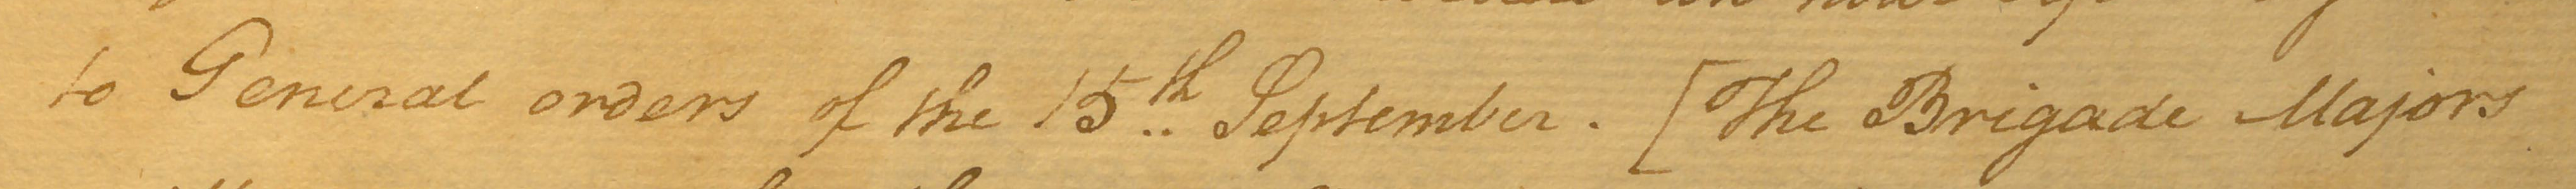to General orders of the 15^th. September. (The Brigade Majors
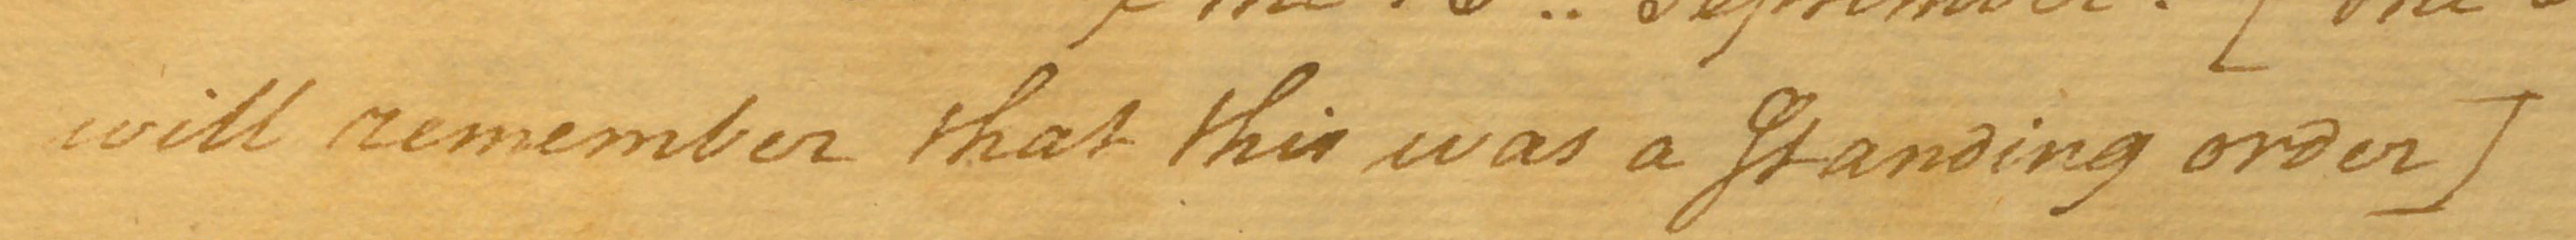will remember that this was a Standing order)
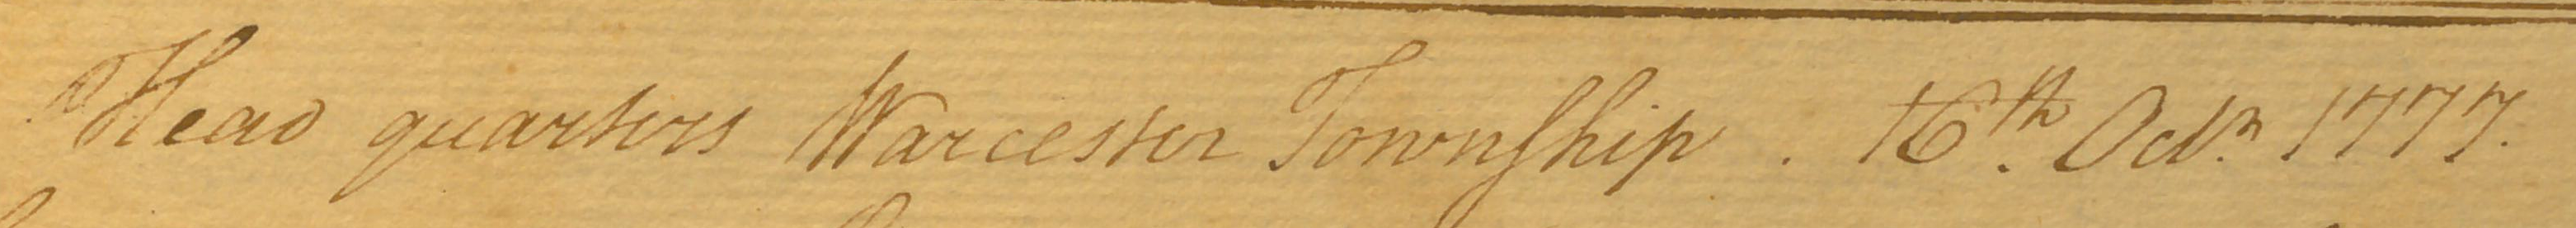Head quarters Warcester Township. 16^th. Oct^r. 1777.
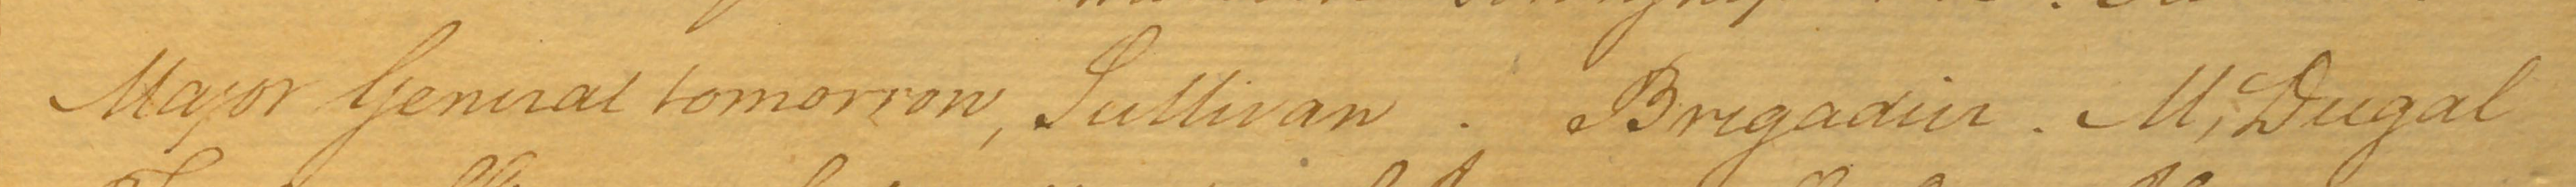Majpr General tomorrow, Sullivan. Brigadier M^cDugal
